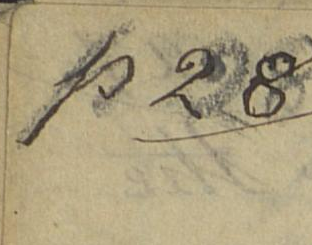p 28
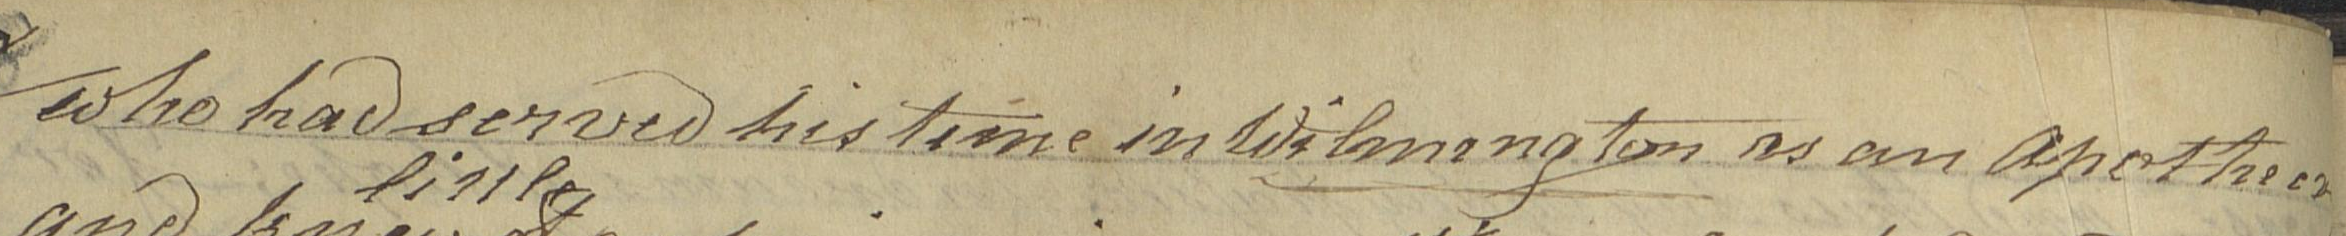who had served his time in Wilmington as an apothec-
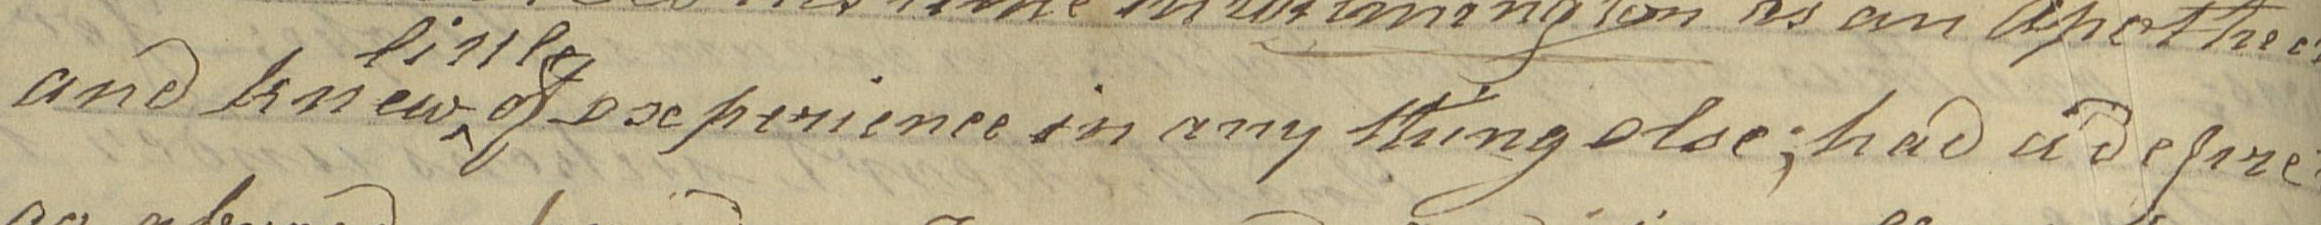and knew ^ of experience in any thing else; had a desire to
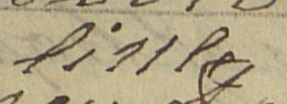little
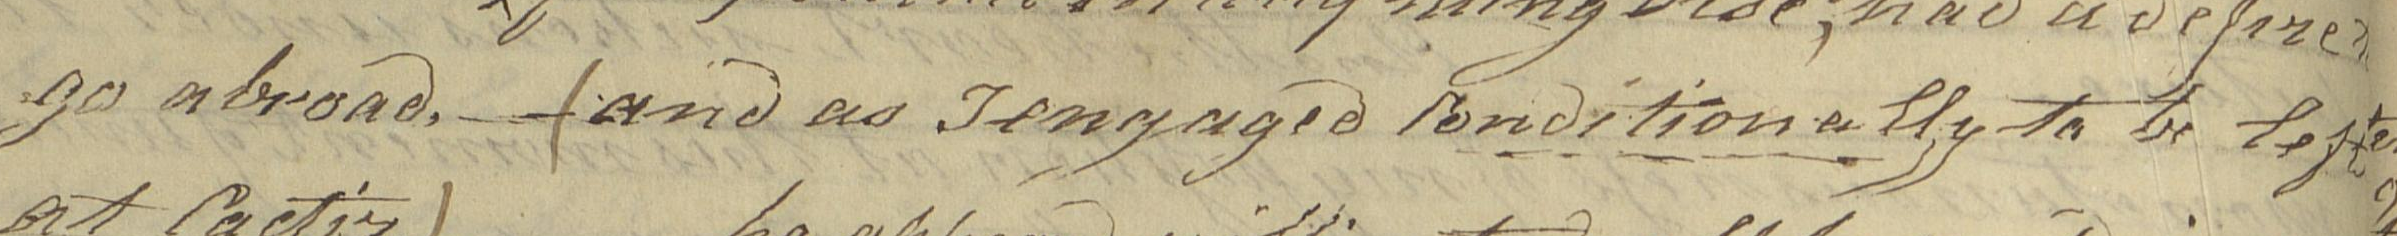go abroad. (and as I engag'd conditionally to be left
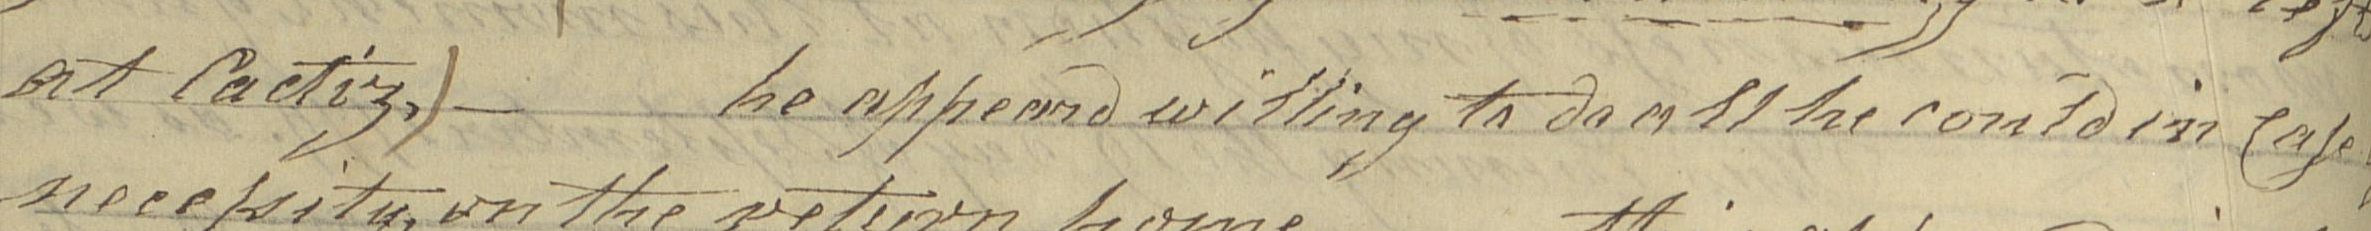at Cadiz.) he appeared willing to do all he could in Case
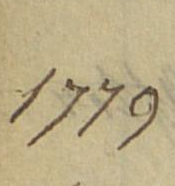1779
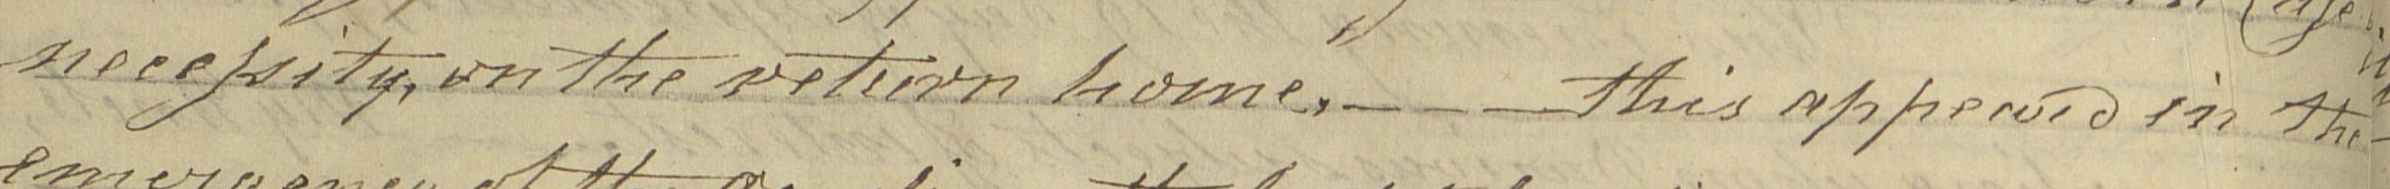necessity on the return home. this appeard in the
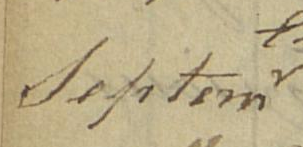Septem^r
